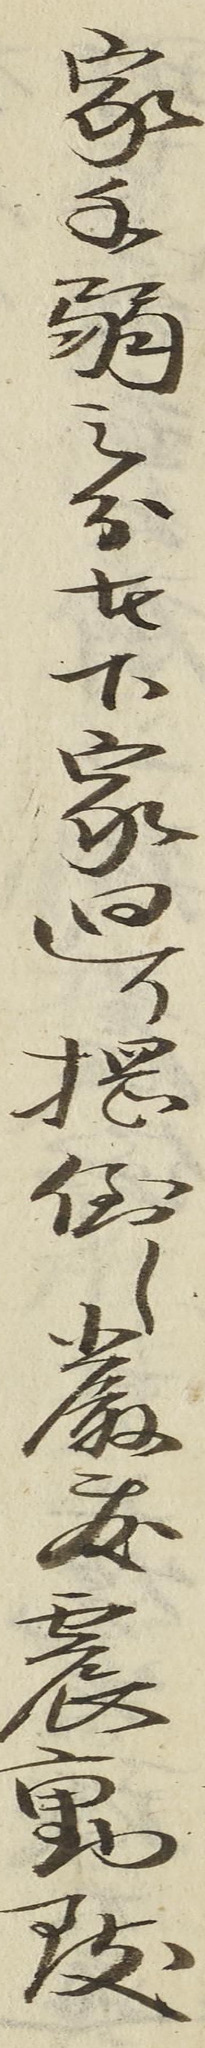家手弱之分は下家廻り揺倒し厳敷震動致
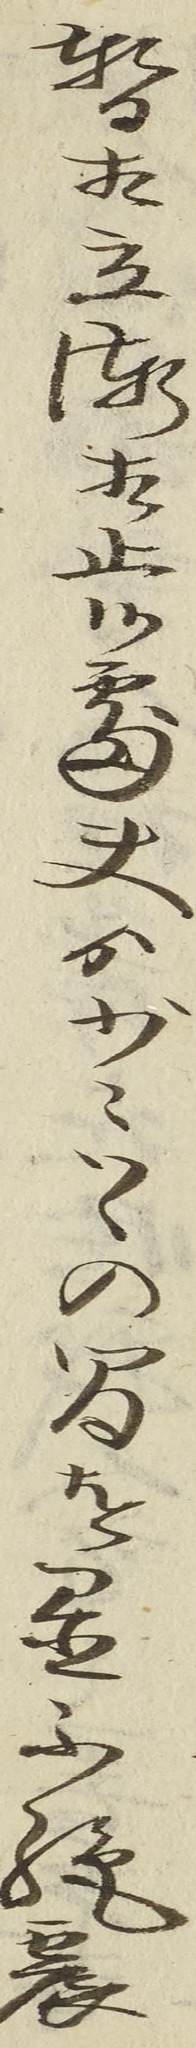暫相立漸相止候処夫ゟ少々ツゝの間を置不絶振
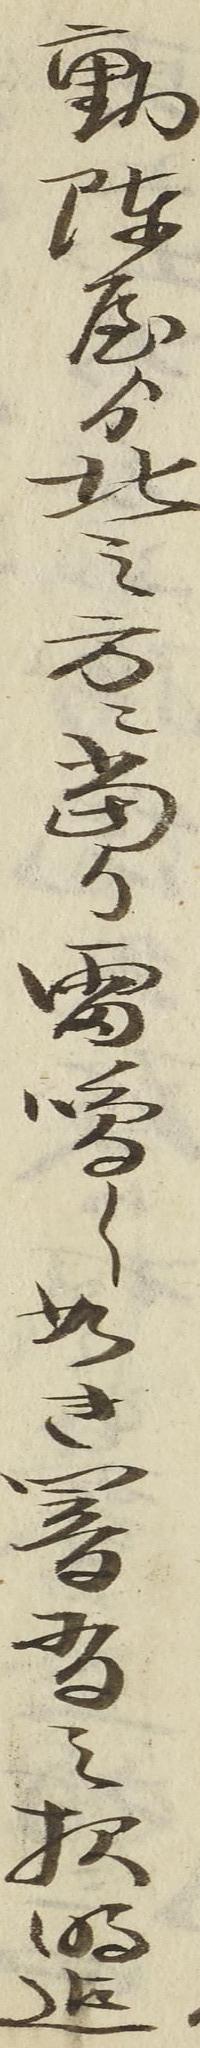動陣屋ゟ北之方二当り雷鳴之如き響有之夜明迄
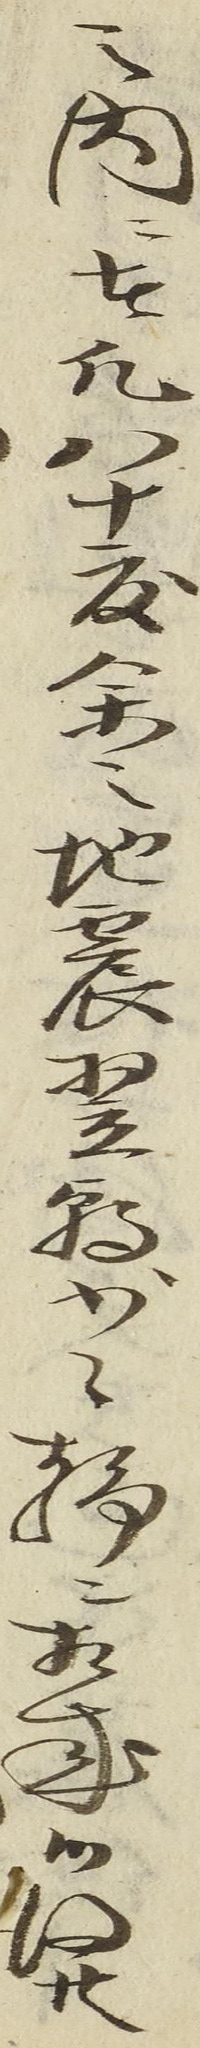之内二は凡八十度余之地震翌朝少々静二相成候得共
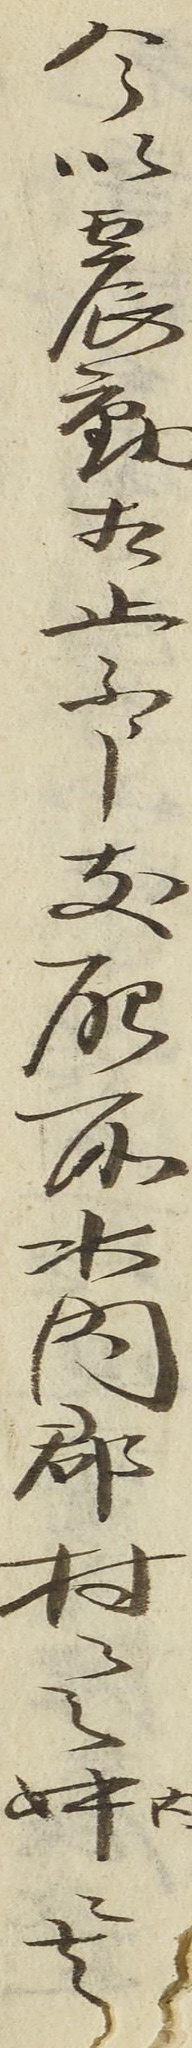今以震動相止不申支配所水内郡村々之内二は
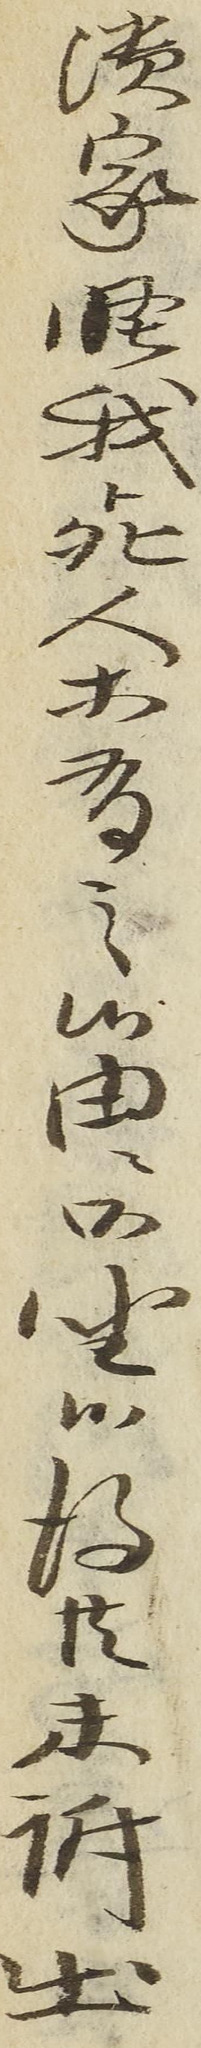潰家怪我死人等有之候由御二座候得共未訴出

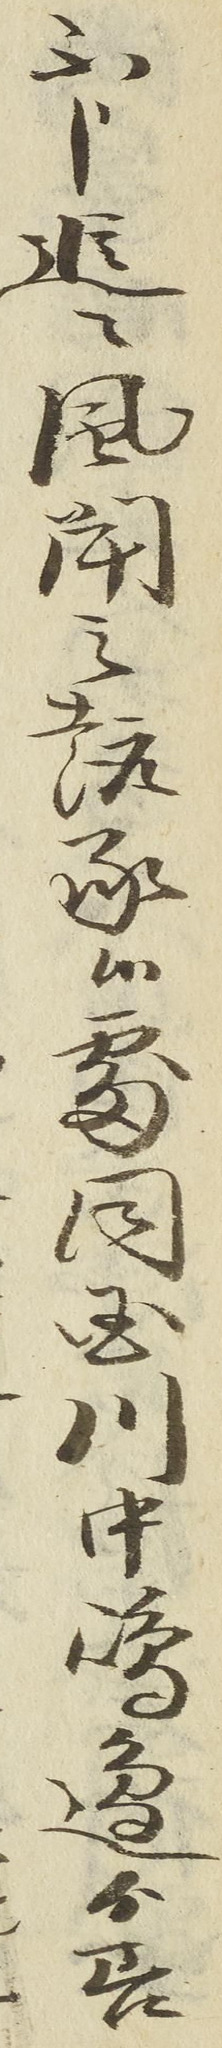不申追々風聞之趣承候処同国川中島辺ゟ善
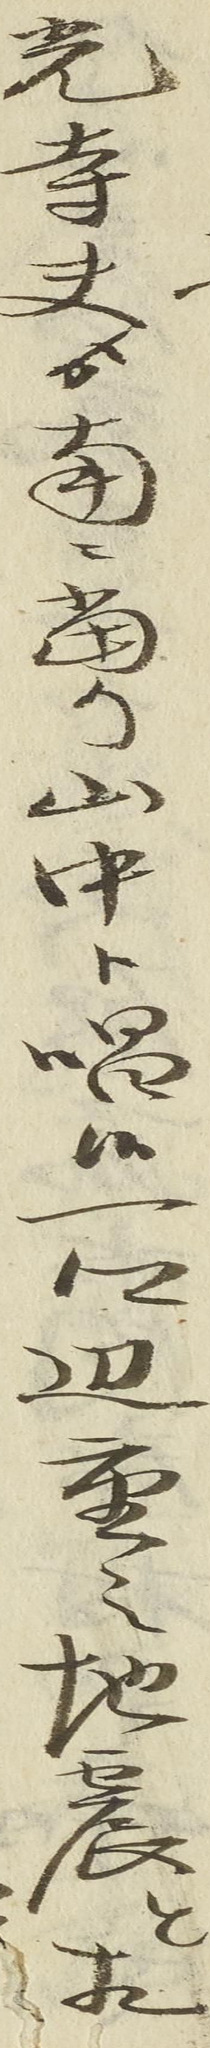光寺夫ゟ南二当り山中と唱候一郷辺重之地震と相
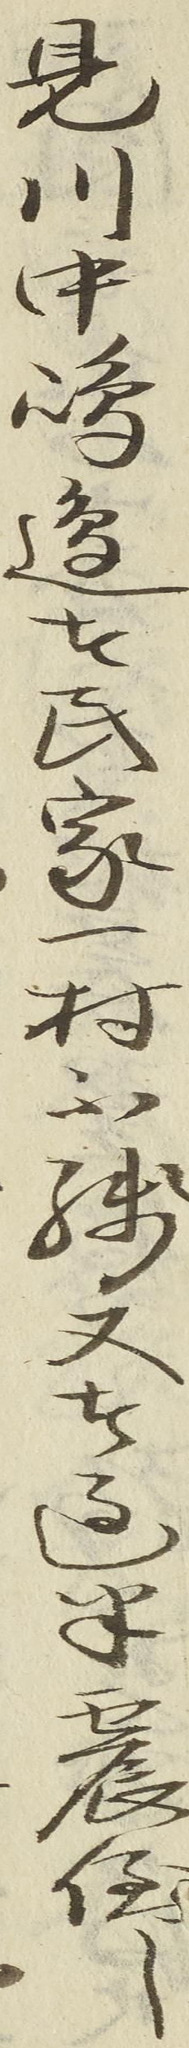見候川中嶋辺は民家一村不残又は過半震倒し
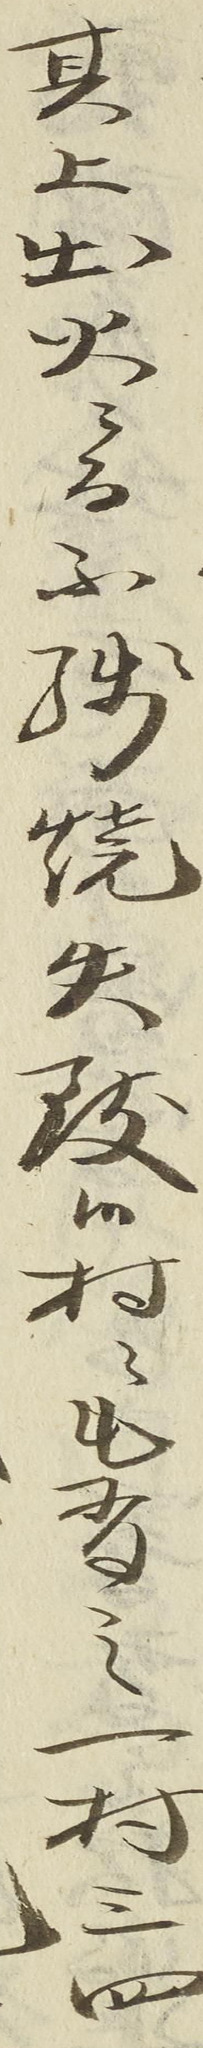其上出火二而不残焼失致候村々も有之一村三四
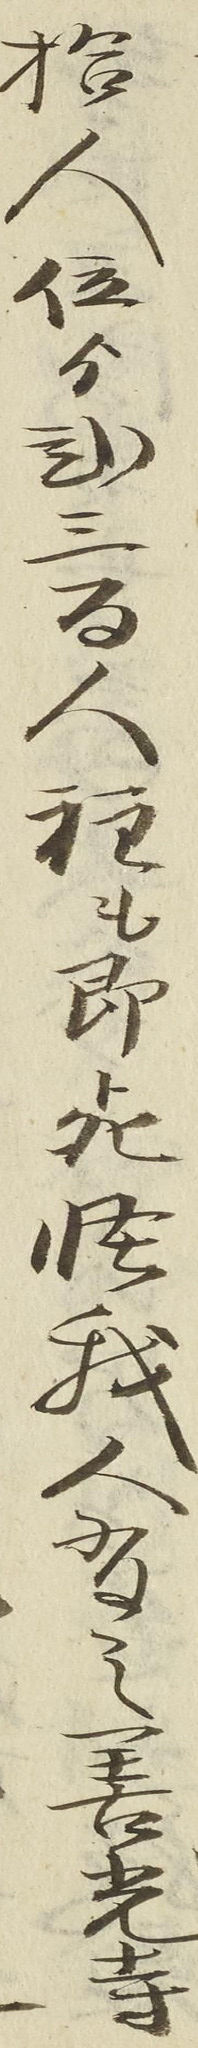拾人位ゟ弐三百人程も即死怪我人有之善光寺
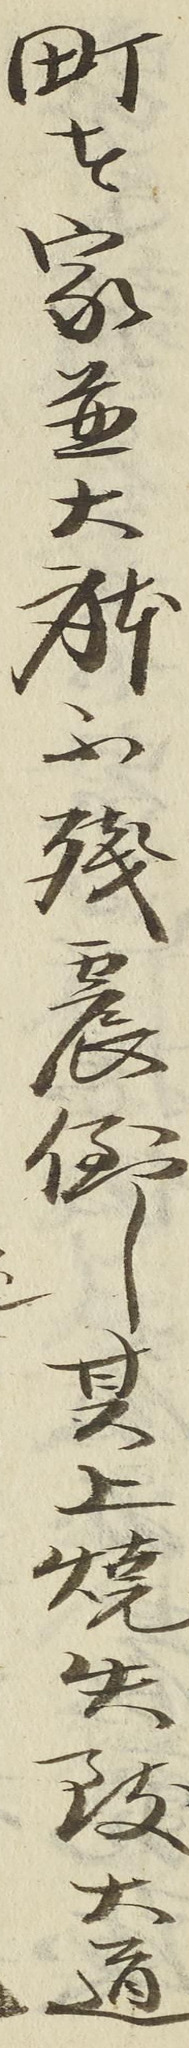町は家並大体不残震倒し其上焼失致大造
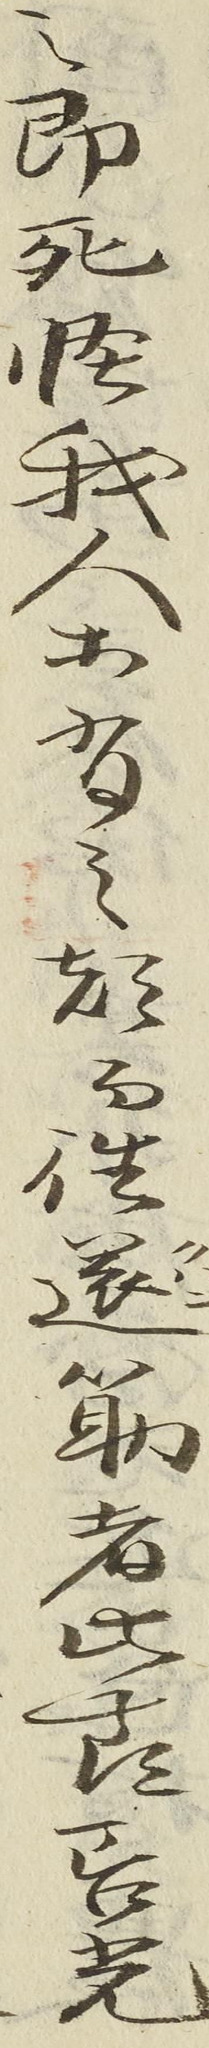之即死怪我人等有之都而往還筋は此節善光
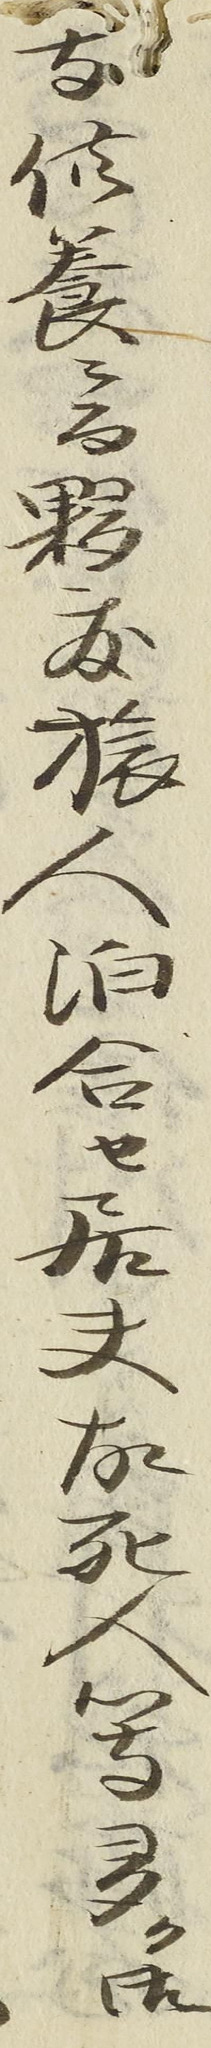寺供養二而夥敷旅人泊合セ居夫故死人等多ク御
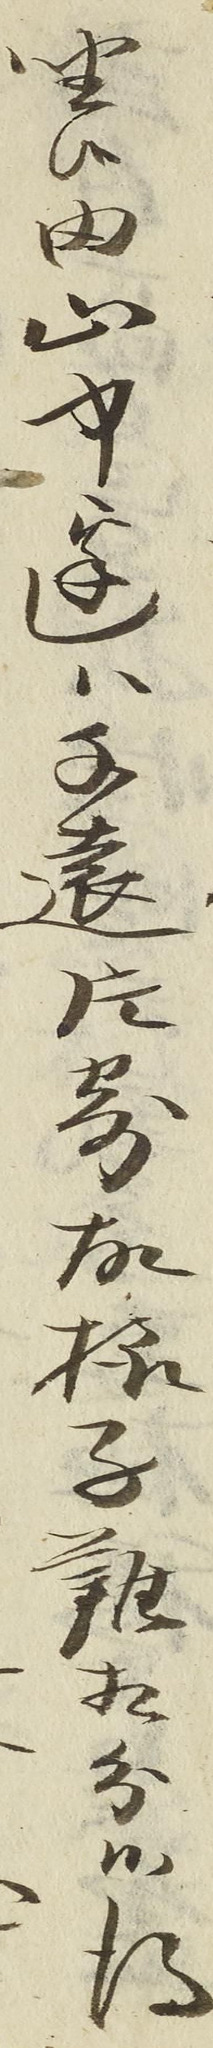座候由山中辺は手遠片寄候故様子難相分候得
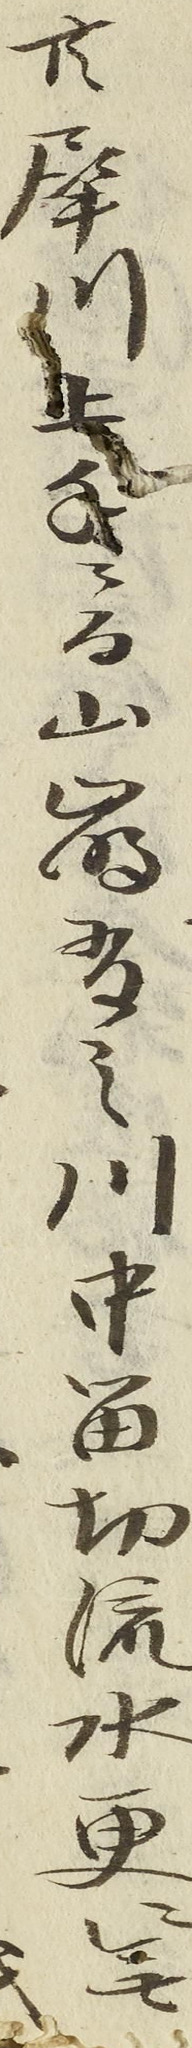共犀川上手二而山崩有之川中留切流水更二無
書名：信濃國大地震記　乾
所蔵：東京大学地震研究所図書室 Earthquake Research Institute Library, The University of Tokyo, JAPAN
